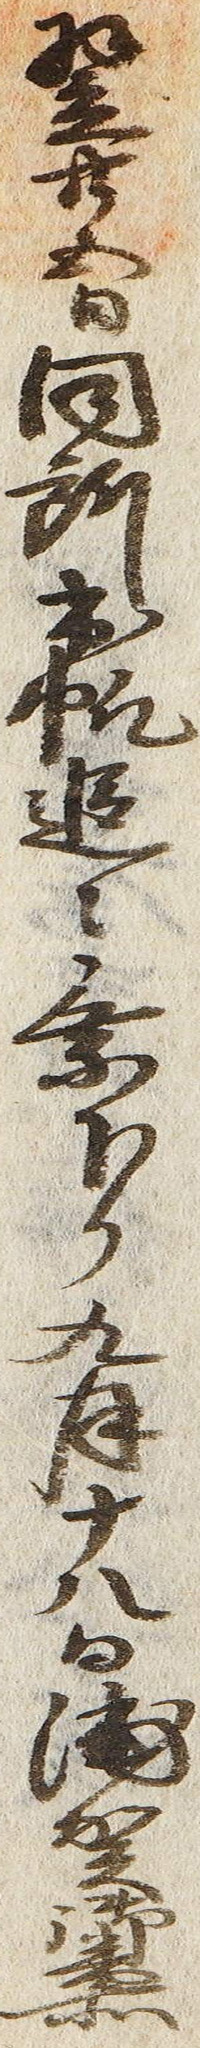翌廿五日同所出帆追々乗下り九月十八日浦賀御番所
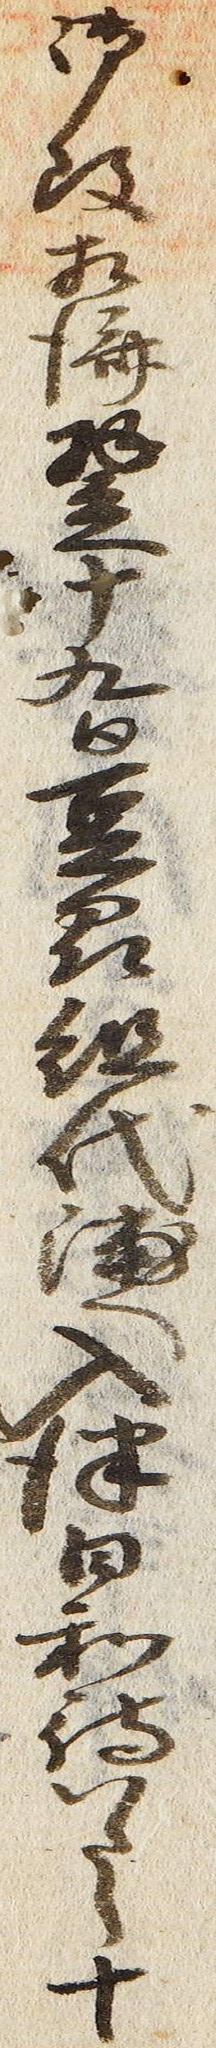御改相濟翌十九日豆州組代浦へ入津日和待いたし十
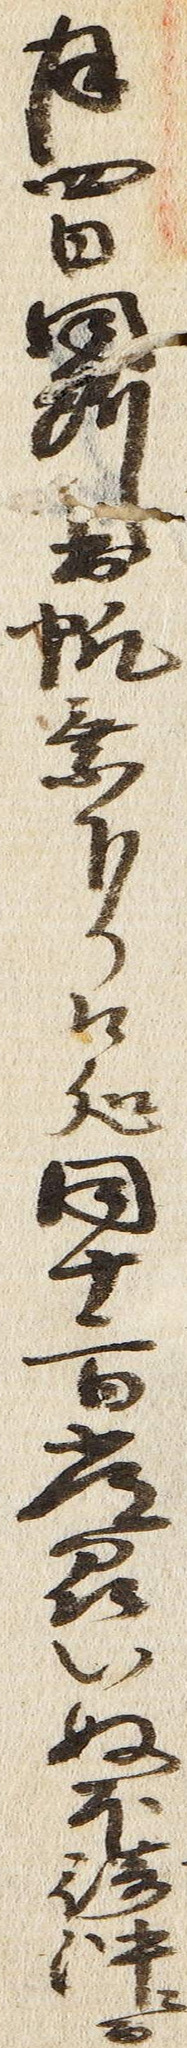月四日同所出帆乗下り候処同十二日常州いぬほ崎沖ニ而
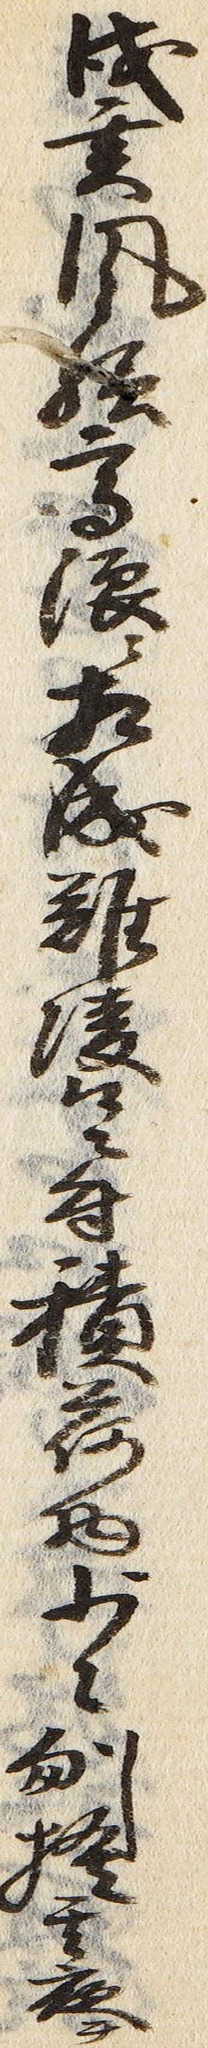戌亥風強高浪ニ相成難凌候ニ付積荷物少々刎捨其夜ヲ
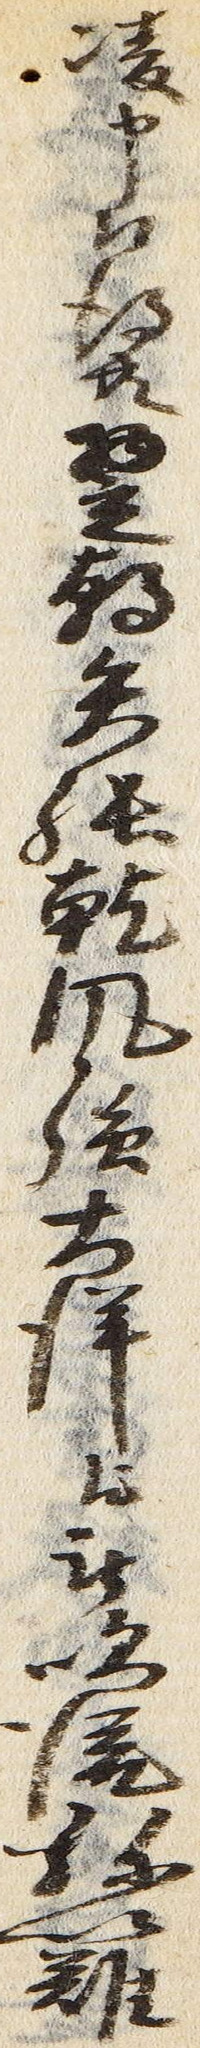凌申候得共翌朝矢張乾風強大洋江被吹流弥以難
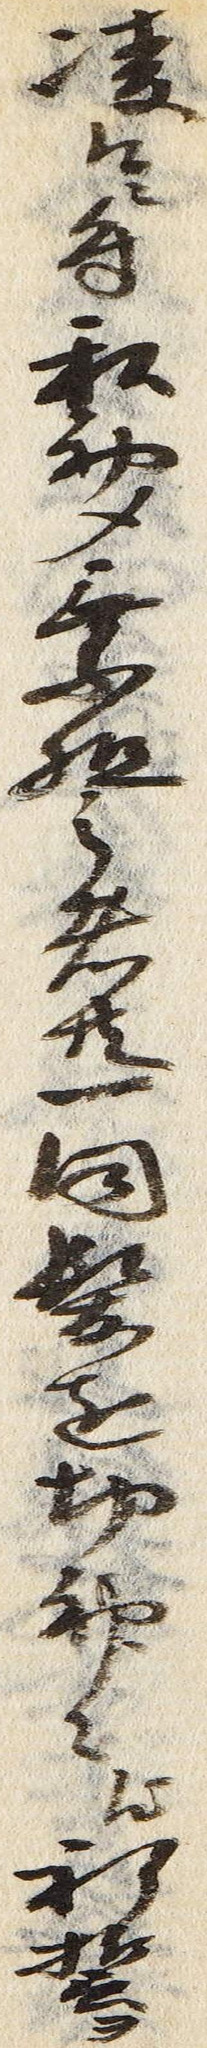凌候ニ付私初メ乗組之者共一同髪を切神々江祈誓ヲ
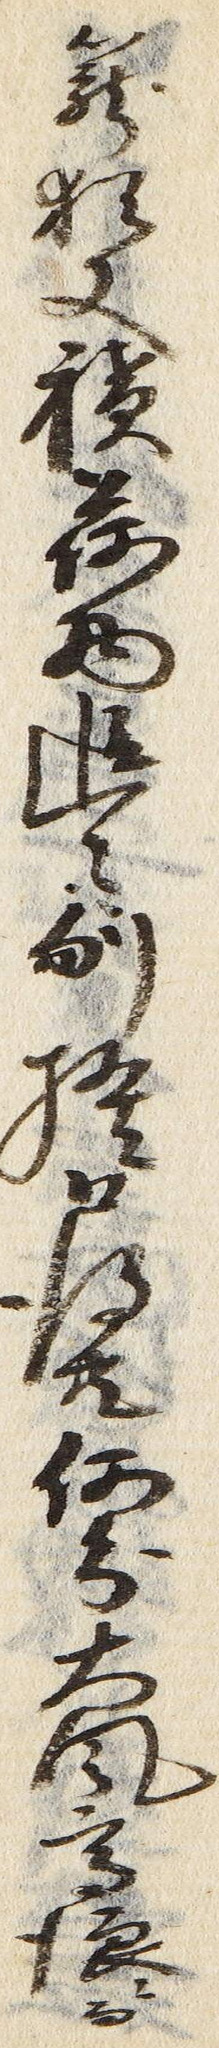籠猶又積荷物追々刎捨候得共何分大風高浪ニ而
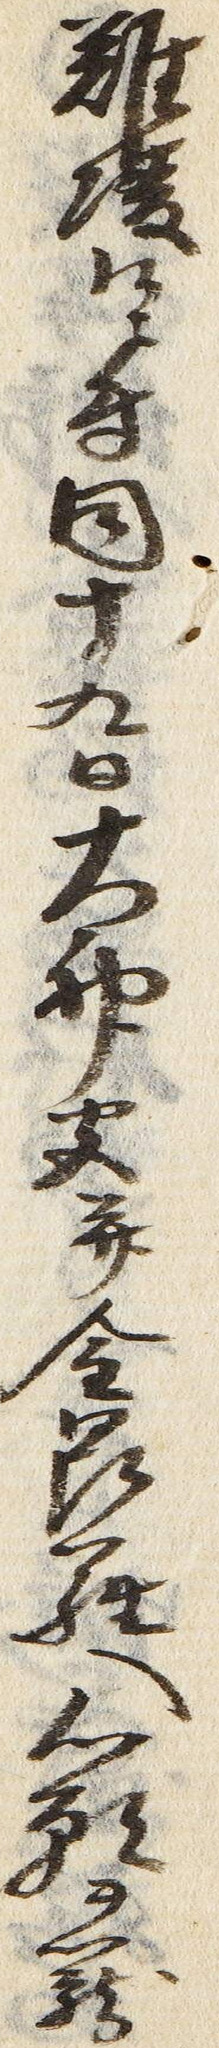難凌候ニ付同十九日大神宮幷金毘羅へ心願ヲ籠
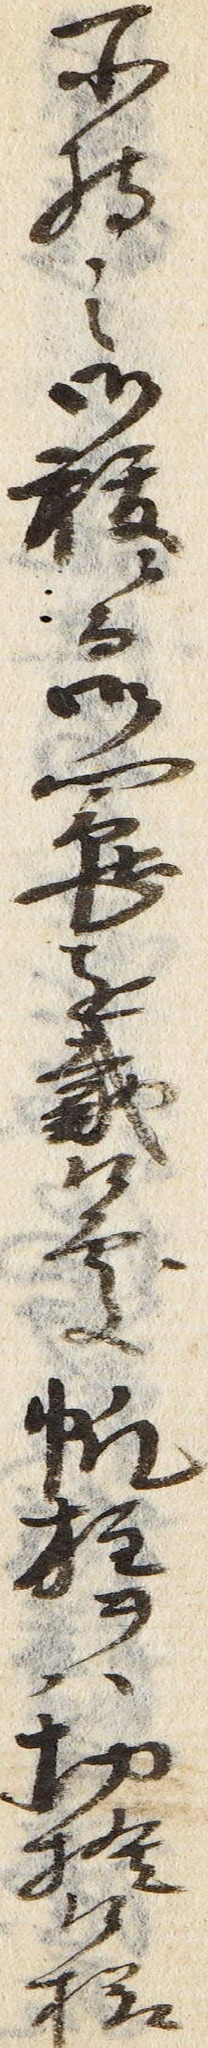所持之御祓ニ而御籤を戴候處帆柱ヲハ切捨候様
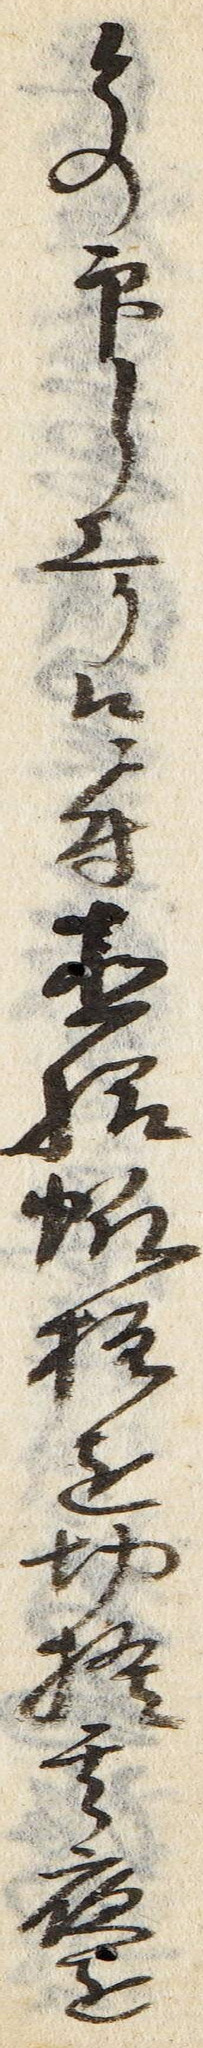との印し上り候ニ付直様帆柱を切捨其夜を
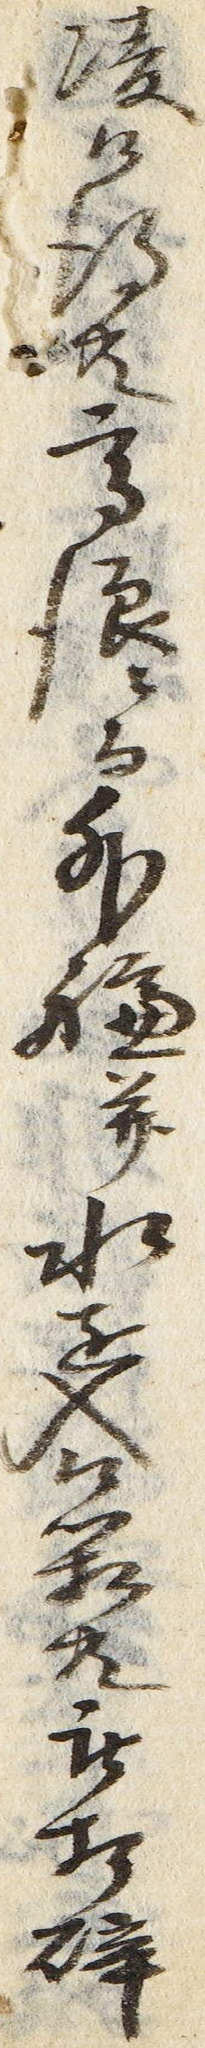凌候得共高浪ニ而外艑并水を入候箱共被打碎

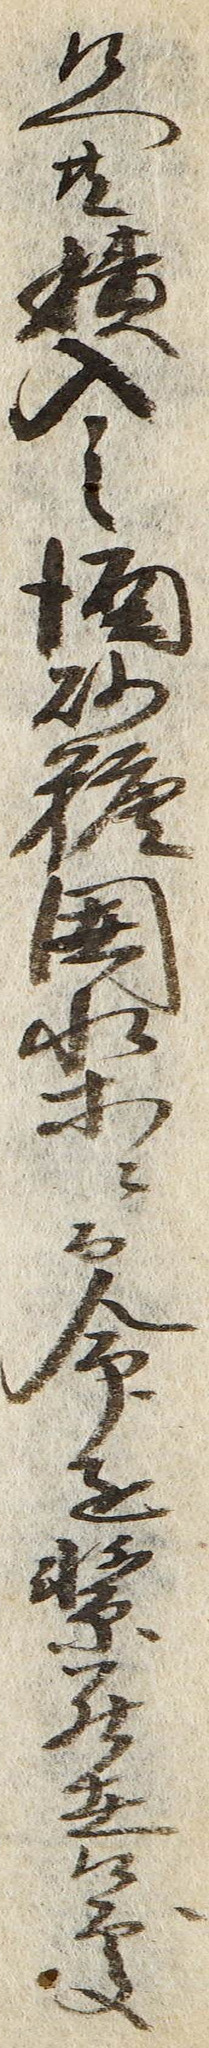候へ共積入之酒砂糖囲水等ニ而命を繋罷在候處
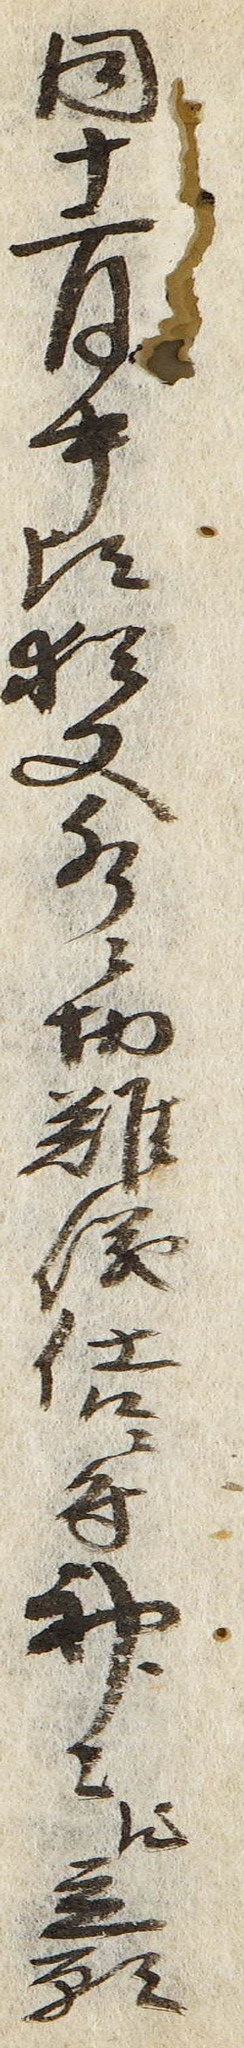同十二月中頃猶又水ニ切難儀仕候ニ付神々江立願
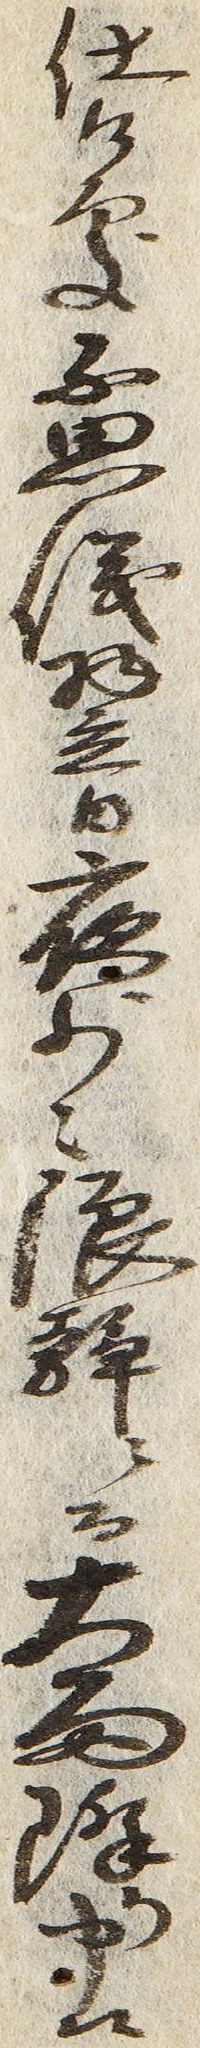仕候處不思議翌日夜少々浪静ニ而大雨降り申候
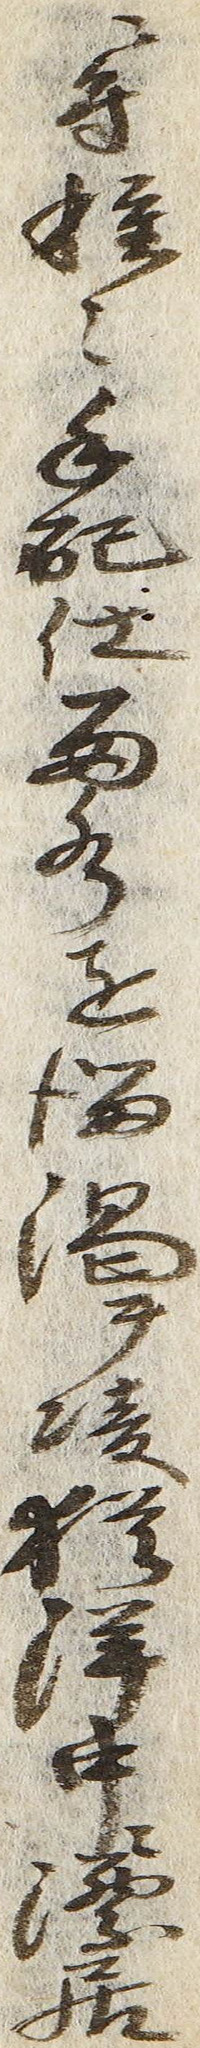ニ付種々手配仕雨水を溜渇ヲ凌猶洋中ニ漂居
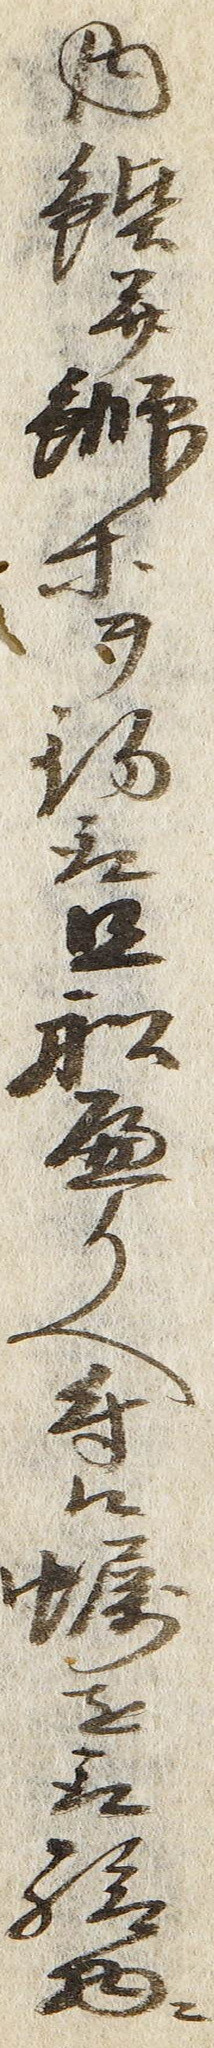内鰹幷鰤等ヲ釣取且舩扁りへ付候蠣を取給物ニ
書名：漂流人善助聞書
